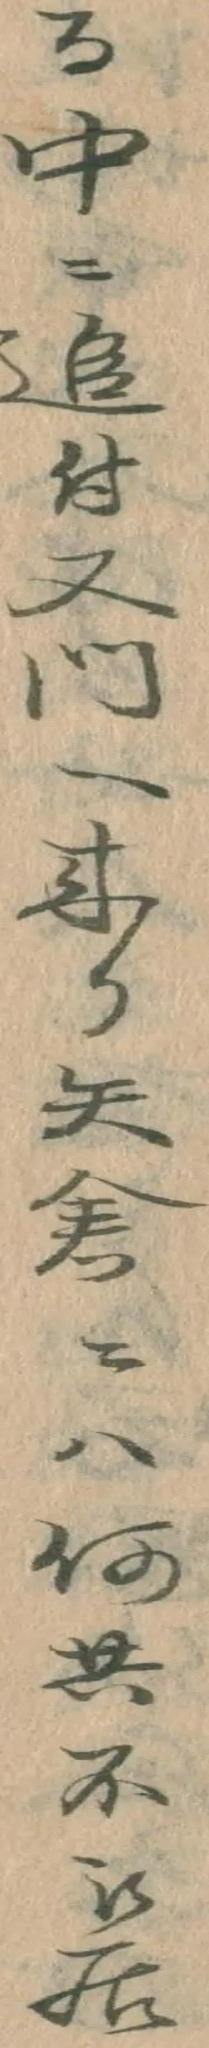る中に追付又門へ来り矢倉には何共不被居
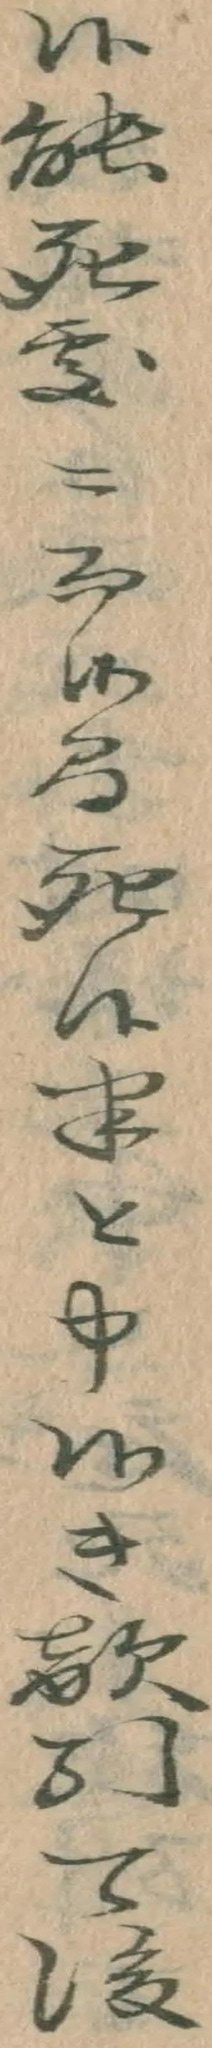候能死処に而候間死候半と申候き敵引て後
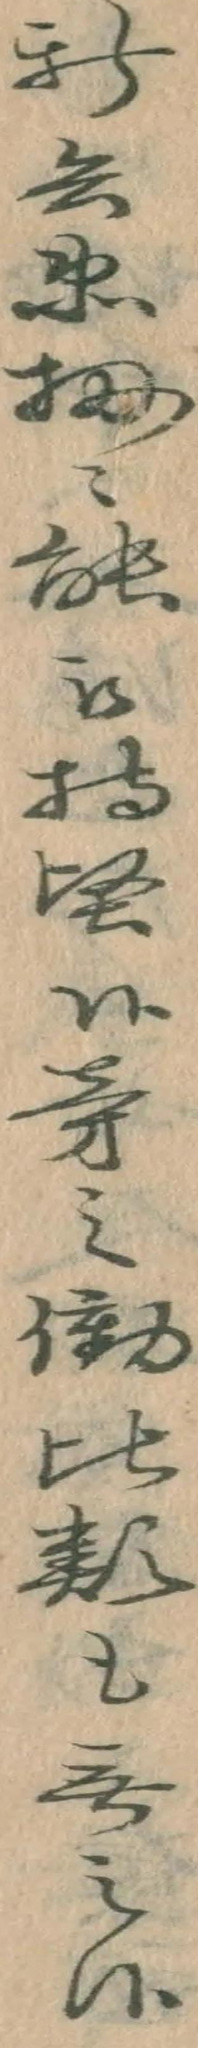新兵衛扨々能被持堅候旁之働比類も無之候
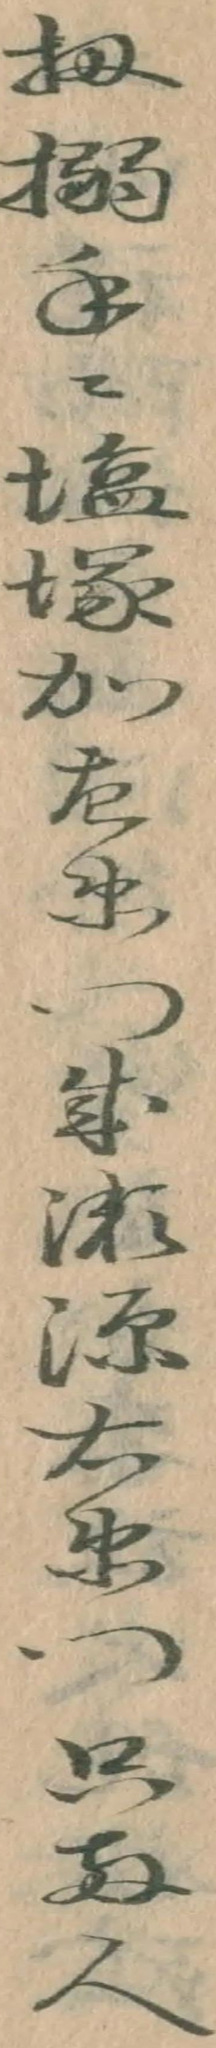扨搦手に塩塚加左衛門成瀬源右衛門只両人
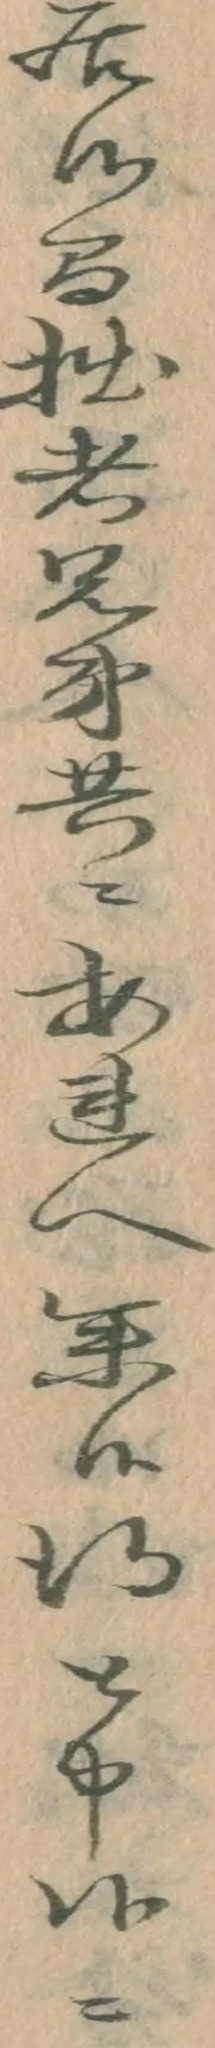居候間拙者兄弟共にあれへ参候と申候に

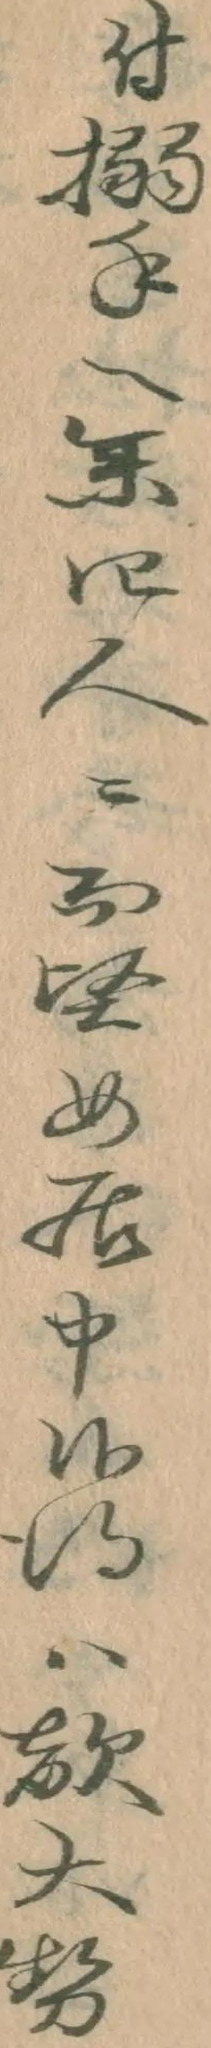付搦手へ参四人に而堅め居申候得は敵大勢
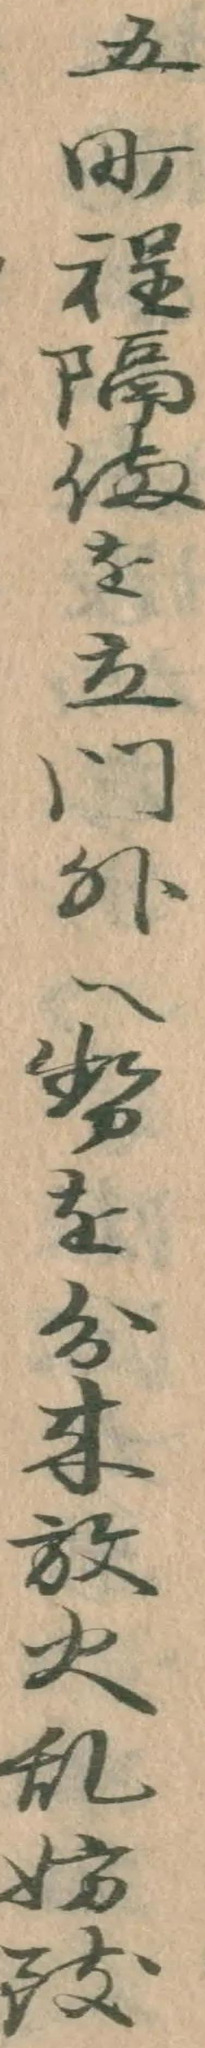五町程隔備を立門外へ勢を分来放火乱妨致
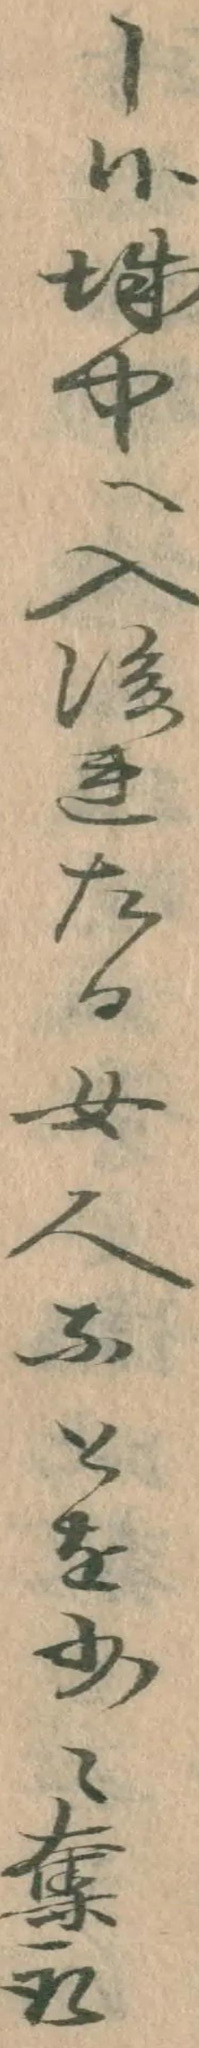し候城中へ入後きたる女人なとを少々奪取
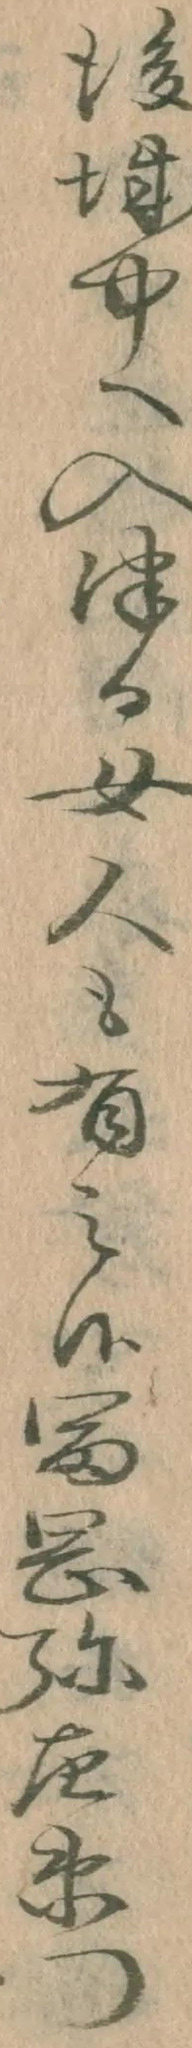後城中へ入つる女人も有之候富岡弥左衛門
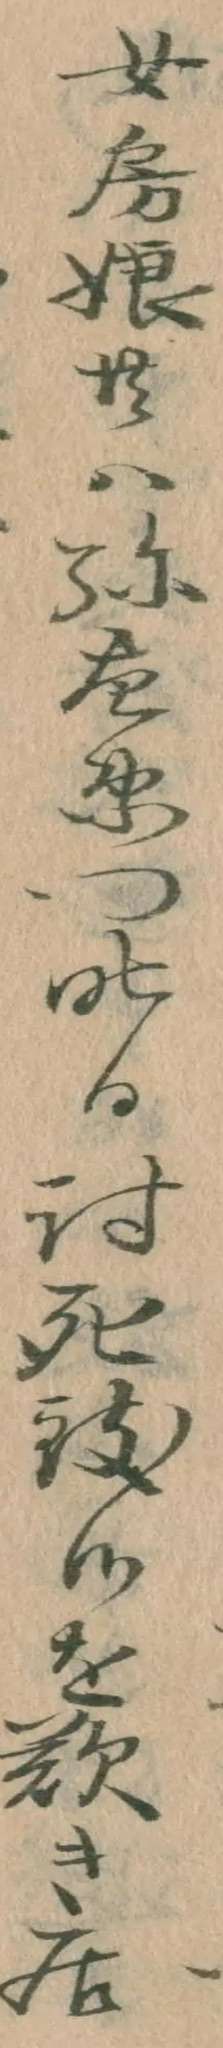女房娘共は弥左衛門昨日討死致候を嘆き居
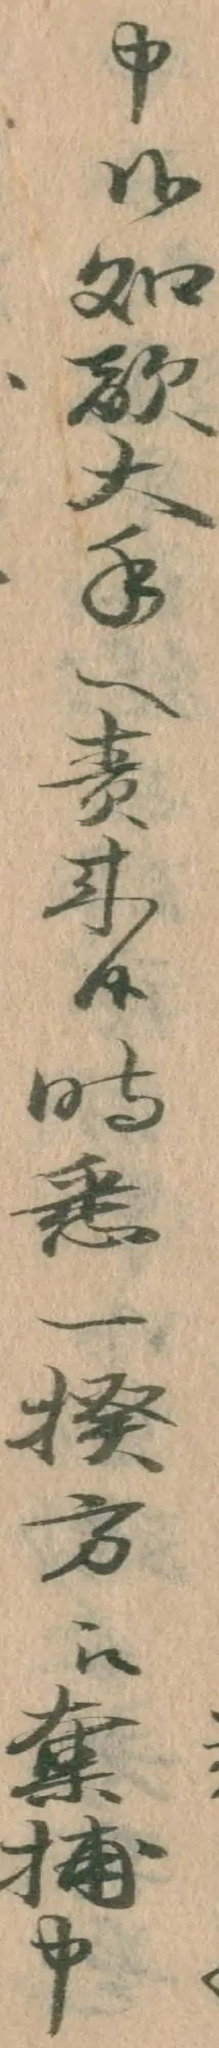申候処敵大手へ責来候時悉一揆方え奪捕申
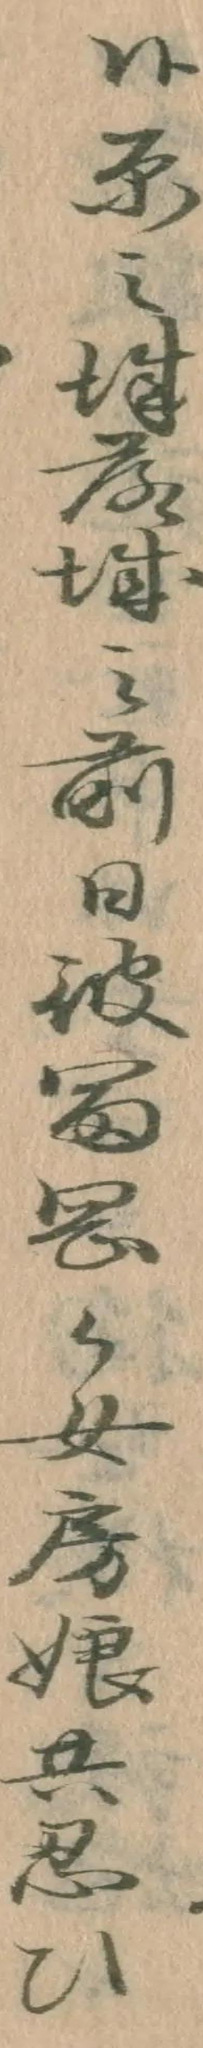候原之城落城之前日彼富岡か女房娘共忍ひ
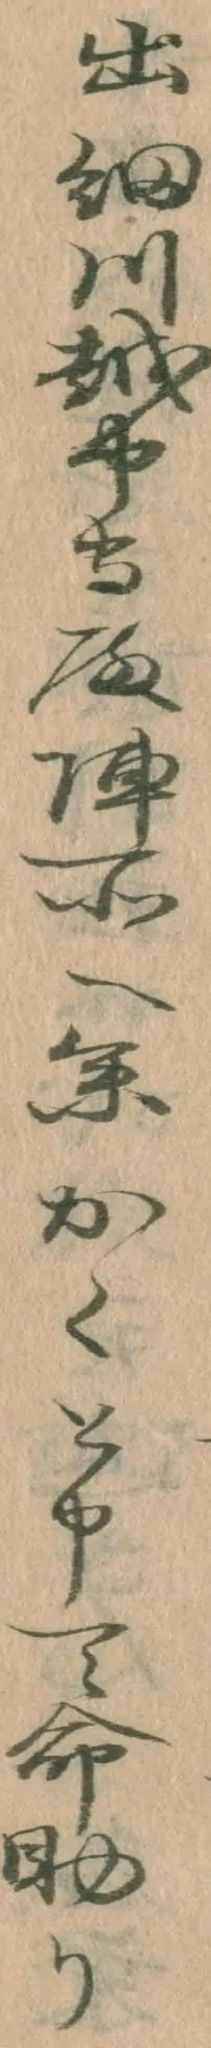出細川越中守殿陣所へ参かくと申て命助り
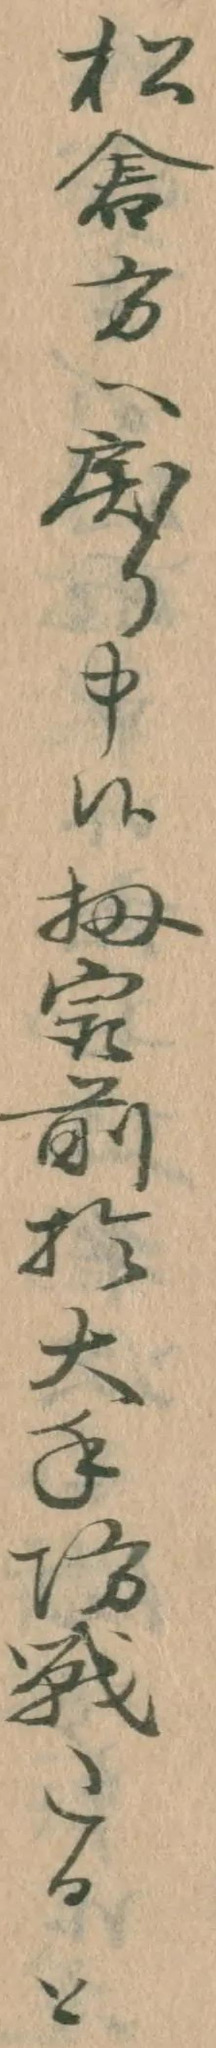松倉方へ戻り申候扨最前於大手防戦たると
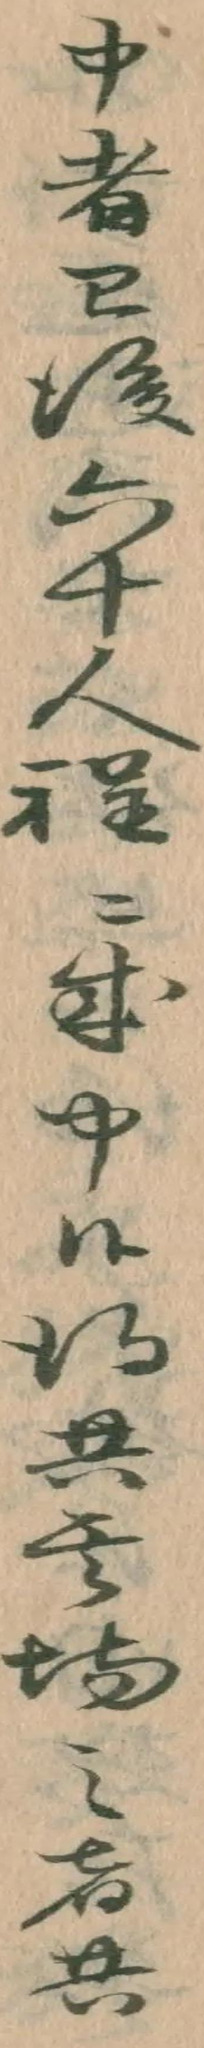申者已後六十人程に成申候得共其場之者共
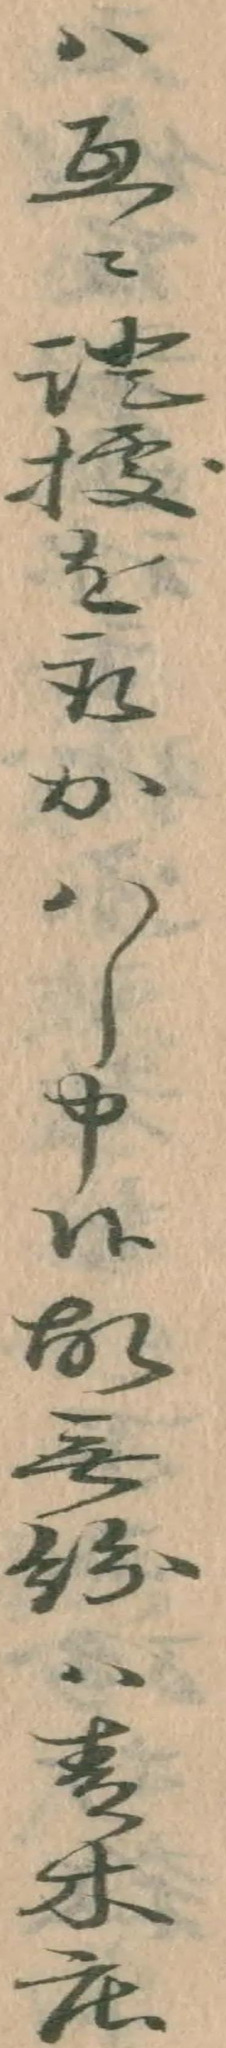は互に証授を取かはし申候故無紛は青木庄
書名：切支丹御退治記 49巻. [1]
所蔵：国立国会図書館 National Diet Library, JAPAN
